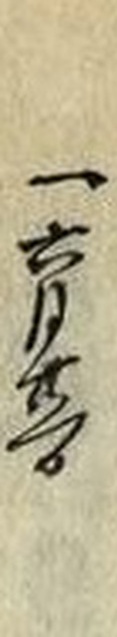一六月廿三日
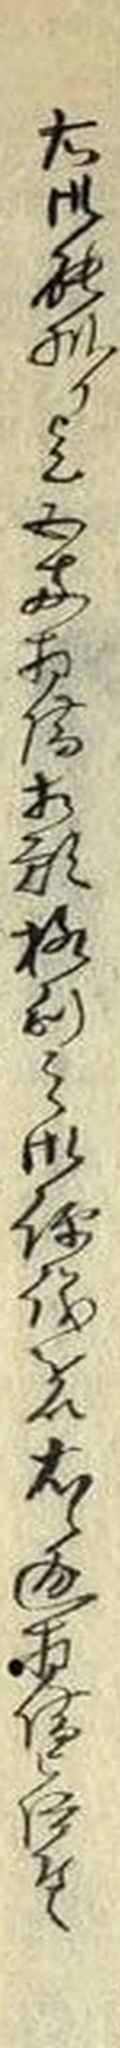右御能掛り迄五両拝借相願格別之御評議を以右之通拝借被仰付候
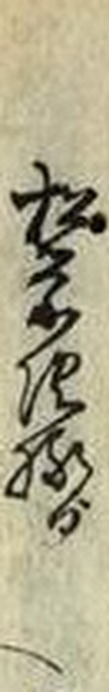松栄院様ゟ
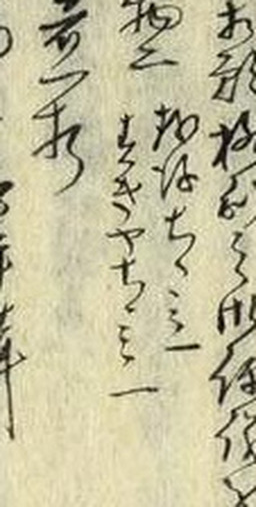すきやちヽみ一
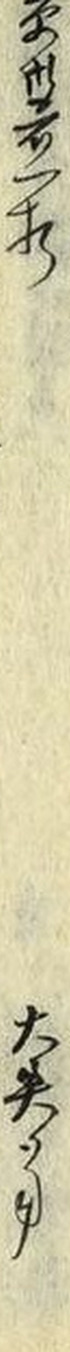交御肴一折大奥御用
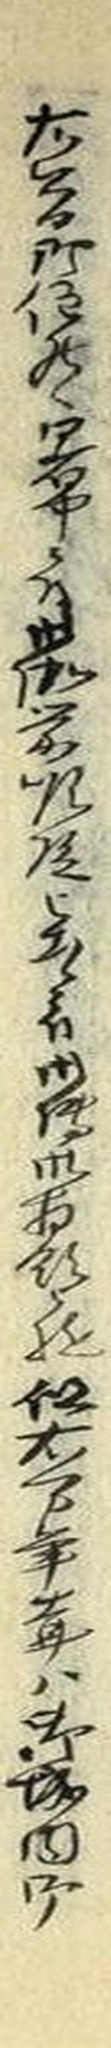右今日御住居へ暑中ニ付御伽栄順殿被出候ニ付御伝御拝領被遊但右万年茸ハ御城内御
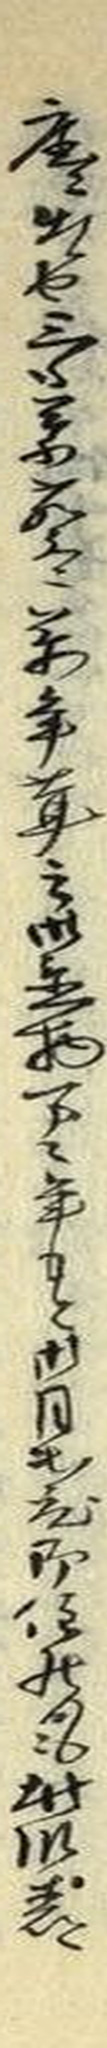庭ニ出候由三ツ葉葵ニ万年茸之御置物万々年もと御目出度御住居ゟも此段表へ
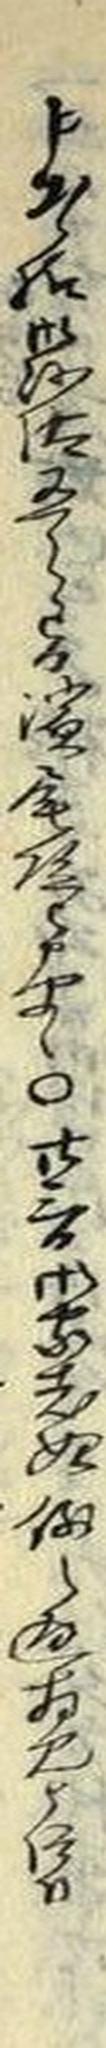申出候様御沙汰有之候旨浜尾殿ゟ被申聞候〇廿三日御家老始例之通拝見被仰付
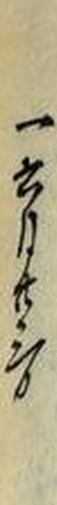一六月廿三日
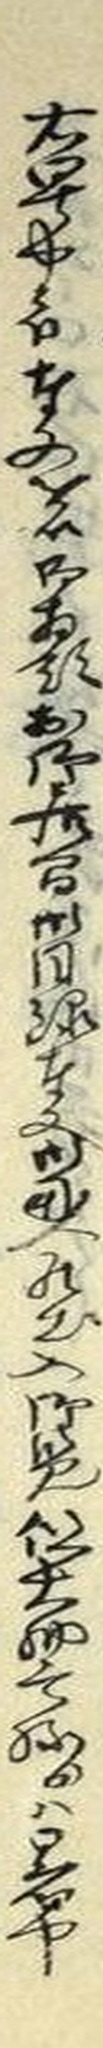右暑中ニ付奉文を以御拝領於御居間御目録奉文御用人罷出入御覧但大納言様ゟハ暑中
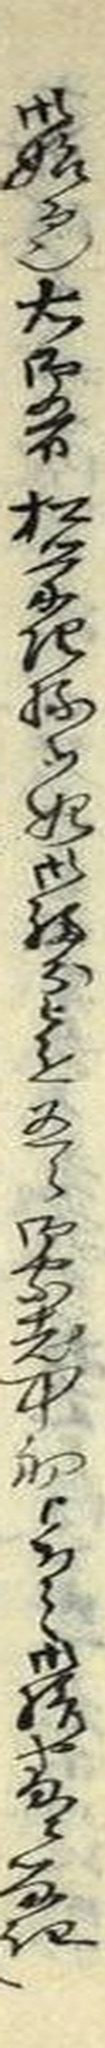御始而也右御肴松栄院様御始御福分被進有之御家老中初被下之御詰番ニ留記有之
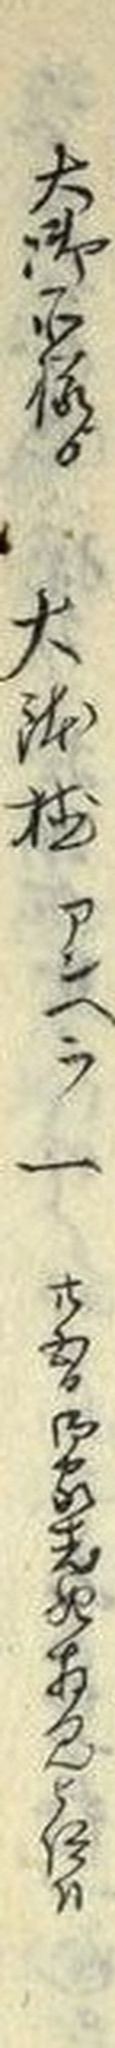大御所様ゟ大鉢植アンヘラ一廿五日御家老始拝見被仰付
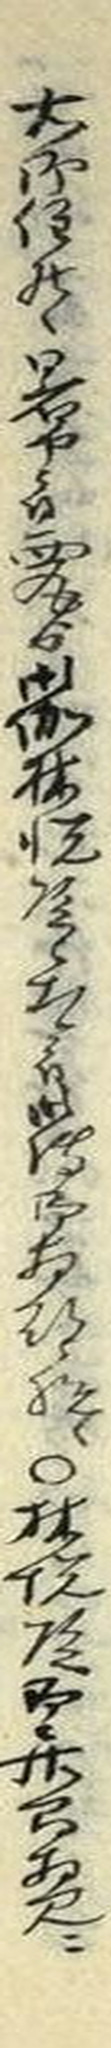右御住居へ暑中ニ付西丸ゟ御伽林悦殿被出候ニ付御伝御拝領被遊候〇林悦殿御居間拝見ニ
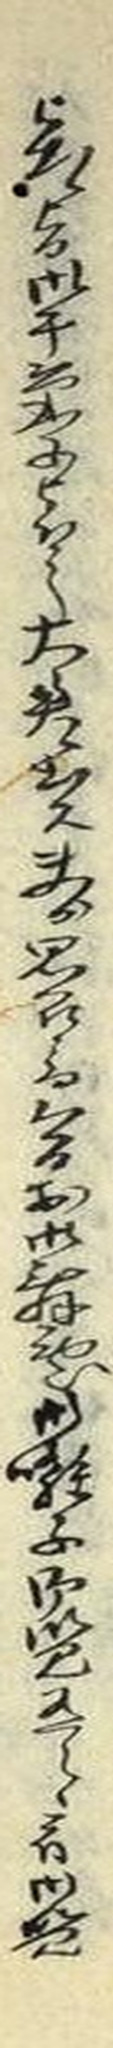被出候旨御干菓子被下之大奥へ出ス夫ゟ思召ニ而今日於御舞台御囃子御覧有之候ニ付御覧
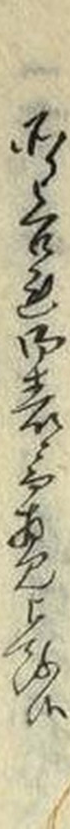所へ被召連御表ニ而拝見被致候
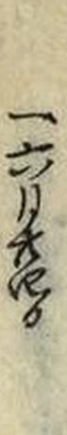一六月廿四日
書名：少傅日録抄（斉善付側向頭取日記、在府）
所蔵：福井県文書館 Fukui Prefectural Archives
